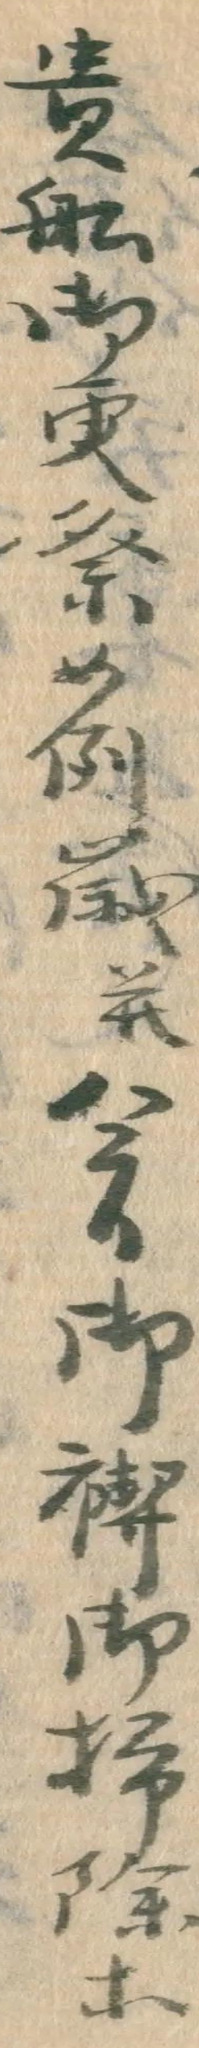貴船御更祭如例、歳并今日御禊・御掃除等
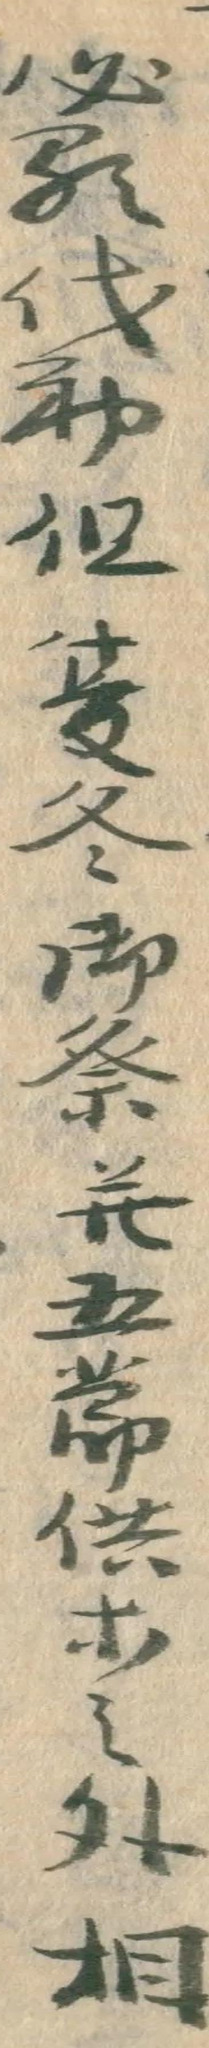必顕代勤、但夏冬御祭并五節供等之外、相
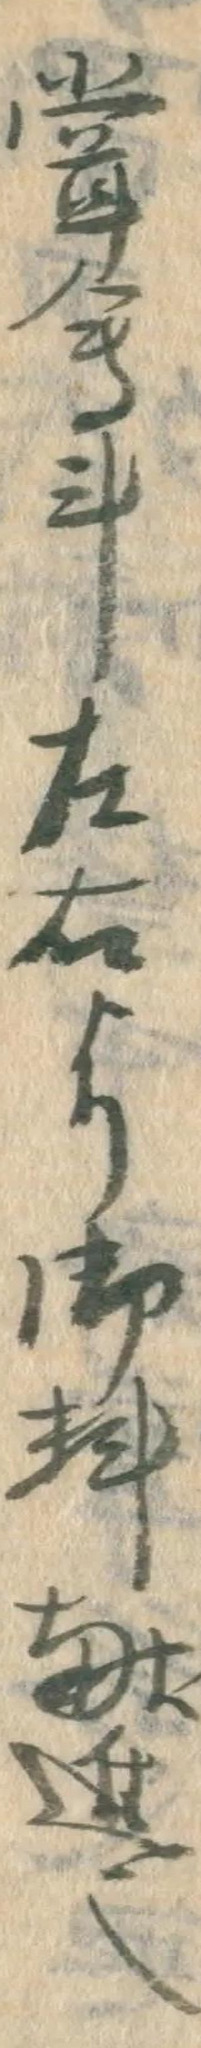嘗會計左右より御料献進也、
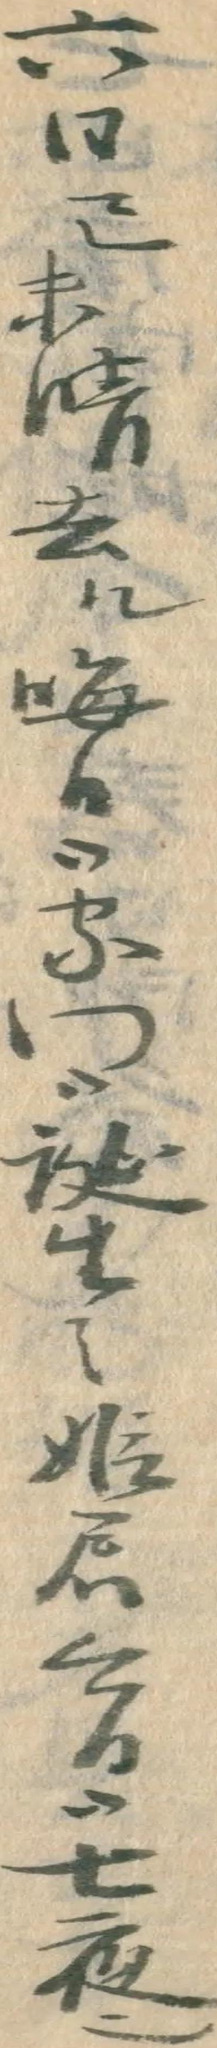六日己未晴、去ル晦日御家門御誕生之姫君、今日御七夜也、
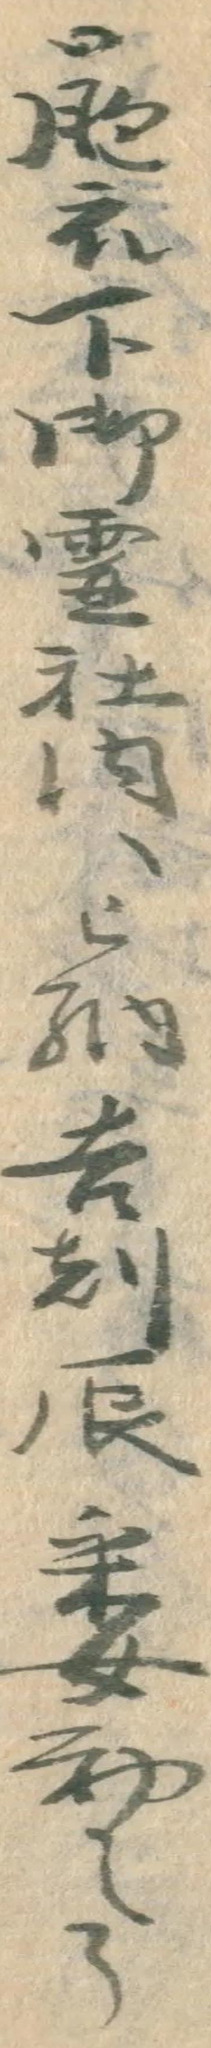御胞衣下御霊社内へ被納、吉刻辰采女勤之了、
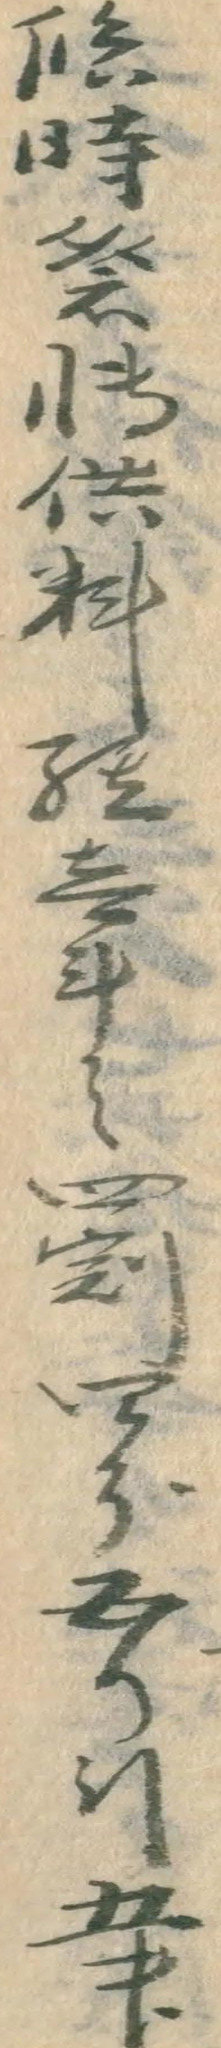臨時祭轉供料類壱斗之四割四分五り引、五升

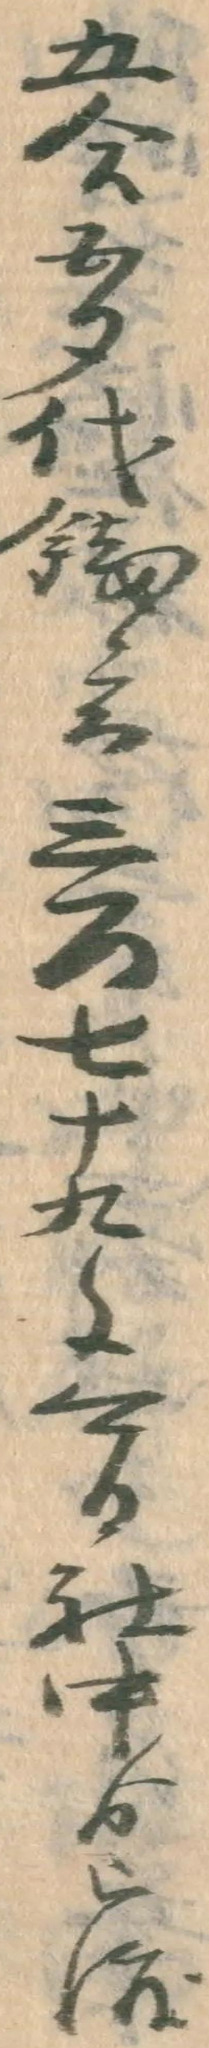五合五勺代銭二而三百七十九文、今日社中ゟ被渡
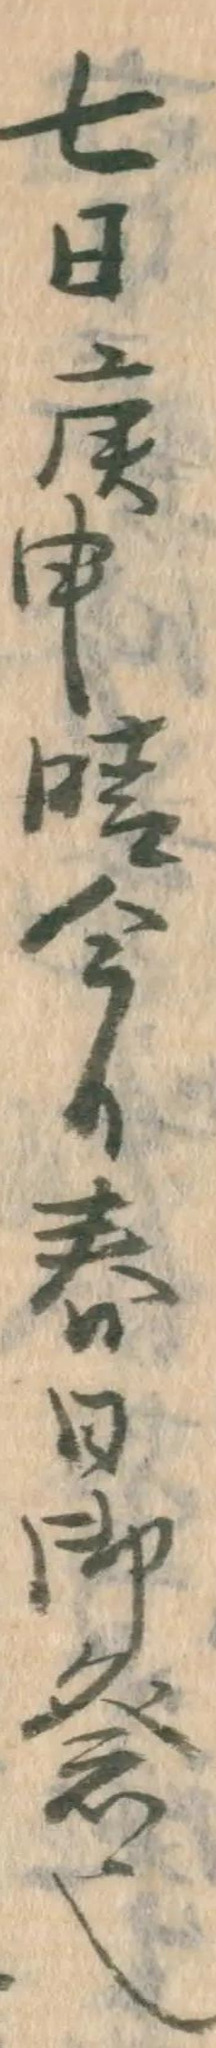七日庚申晴、今日春日御祭也、
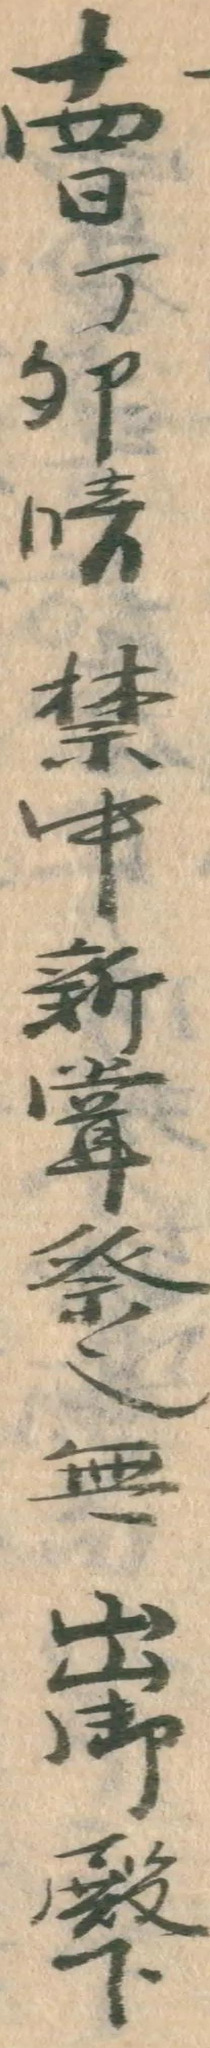十四日丁卯晴、禁中新嘗祭也、無出御殿下
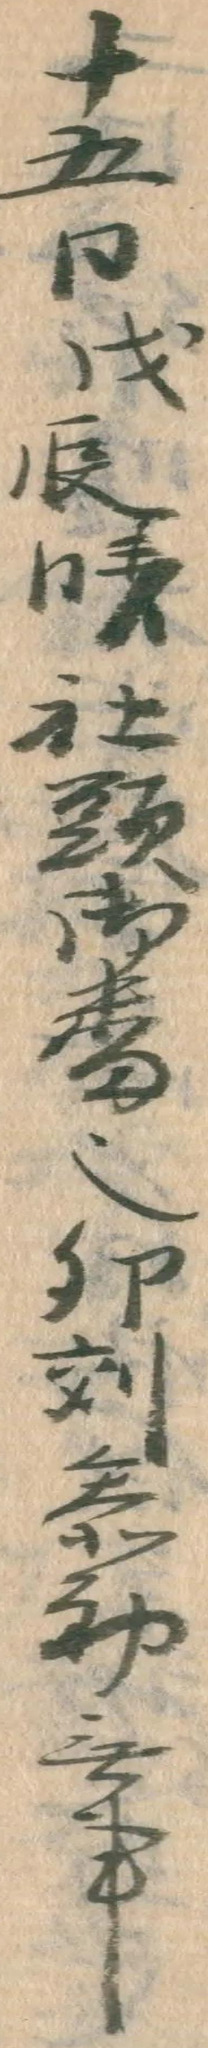十五日戊巳晴、社頭御番也、卯刻参勤無事、
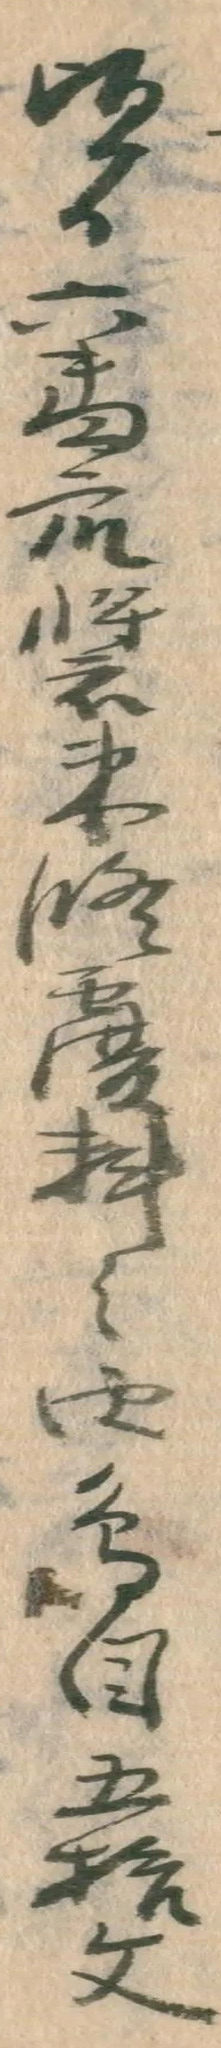頃日六番衆装束修覆料之由、鳥目五拾文
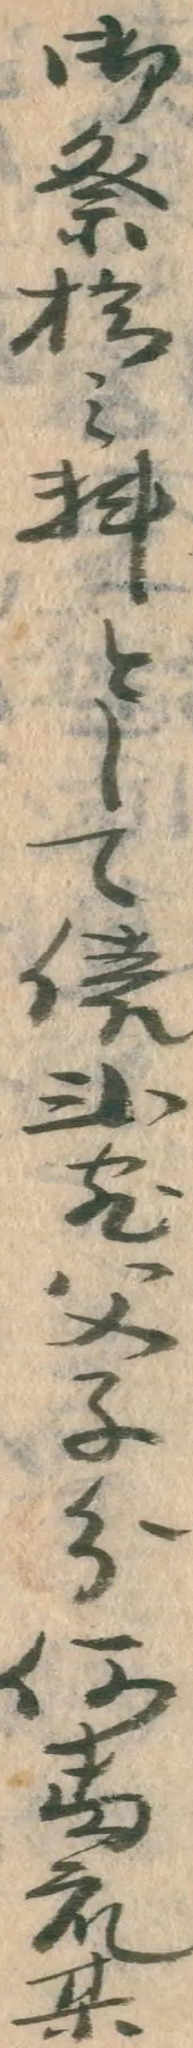御祭橋之料として俵弐宛父子分何番衆某
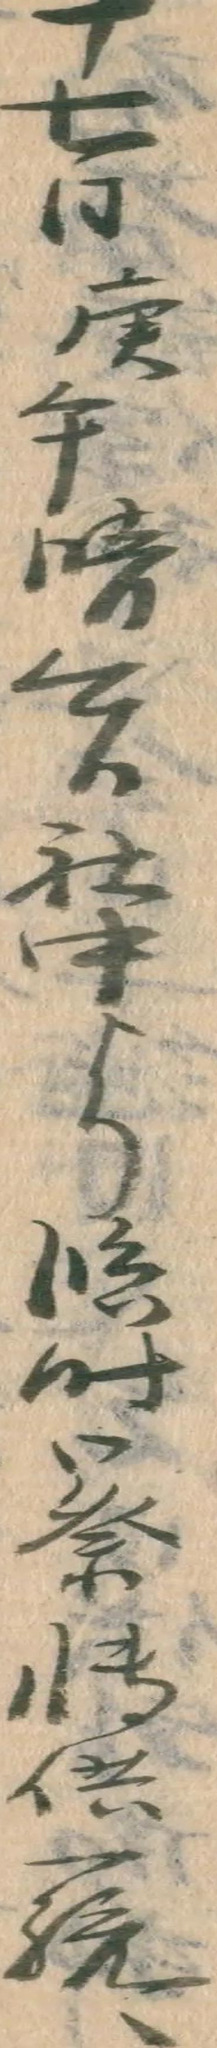十七日庚午晴、今日社中より臨時御祭轉供一統へ
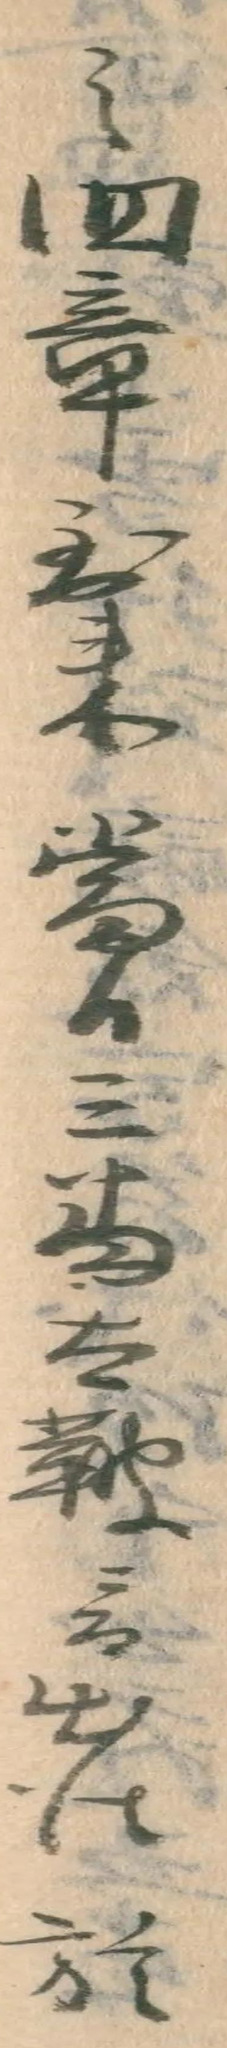之四輩到来、當日三番太鼓ニ而出仕、於
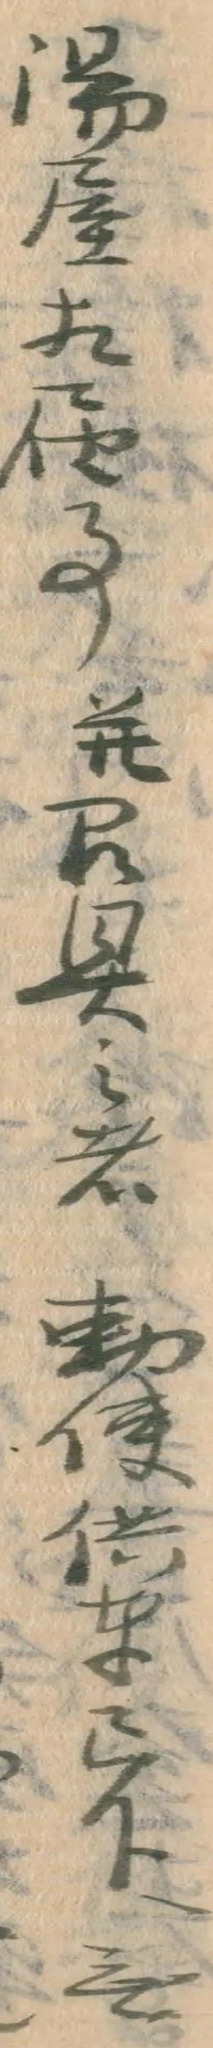湯屋相届事并召具之者、勅使供奉已下へ無
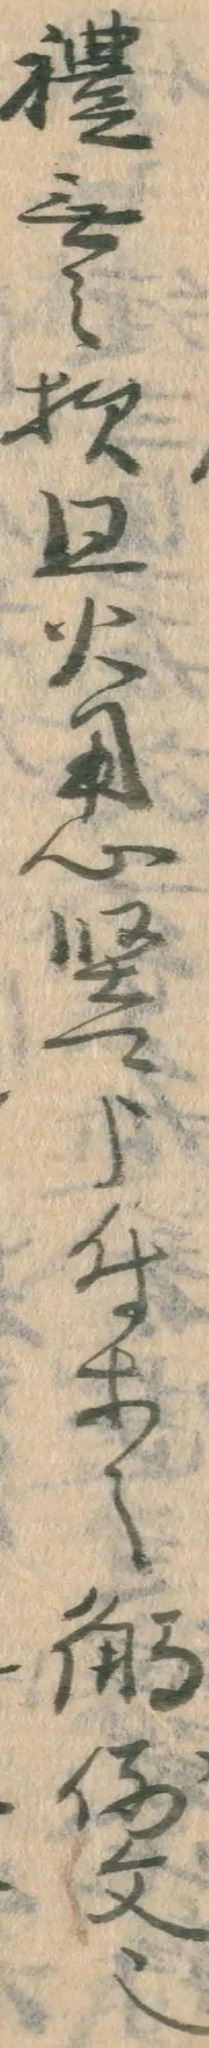禮無之様、且火用心堅可申付等之触、例文也、
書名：賀茂社記録. 第63冊
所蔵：国立国会図書館 National Diet Library, JAPAN
